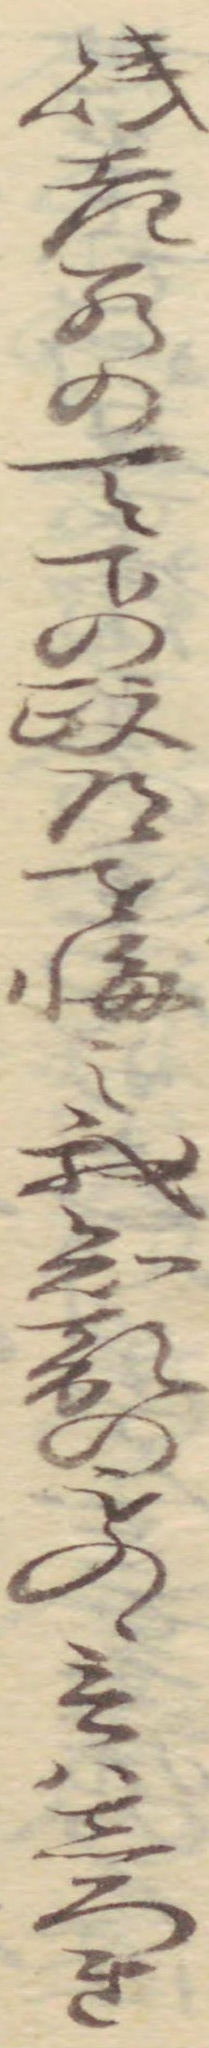賎老若の天下の政道を悔み我知顔のものゝ言はしろき
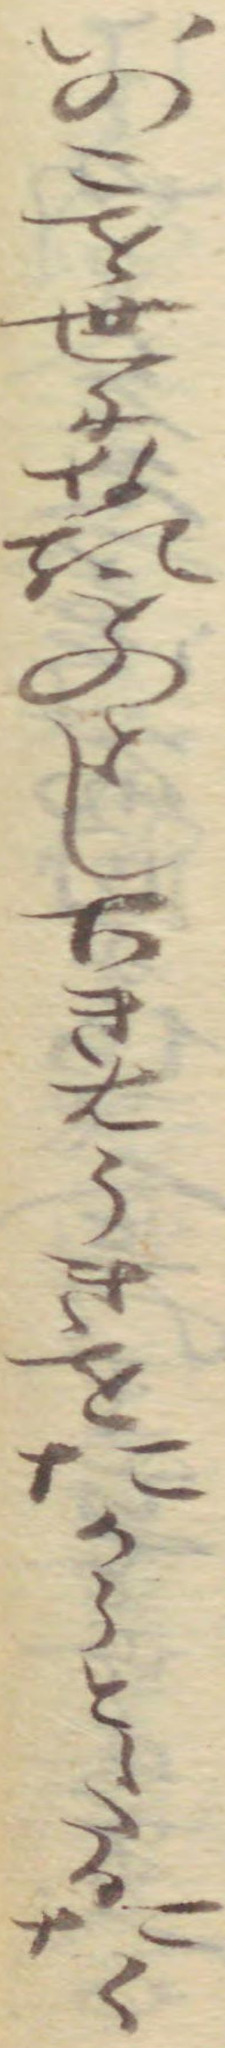いのこを世になきものとし古きはうきをたからとしたるたく
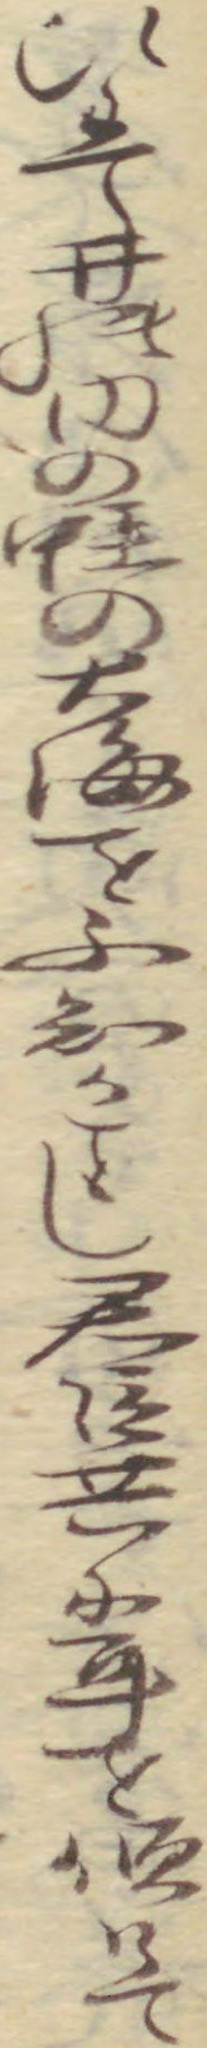ひにて井の内の蛙の大海を不知かことし君臣共に耳を傾けて
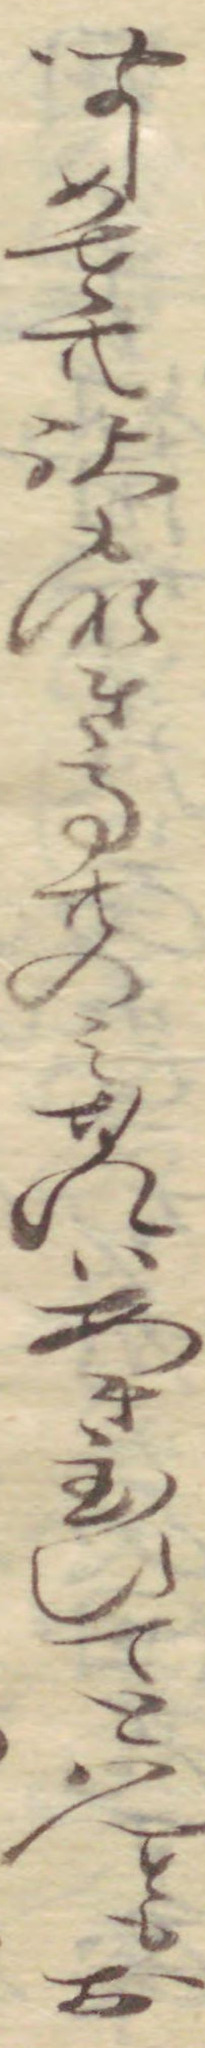聞しめせ共訳もなき事共のみなれはあき玉ひてとはんともお
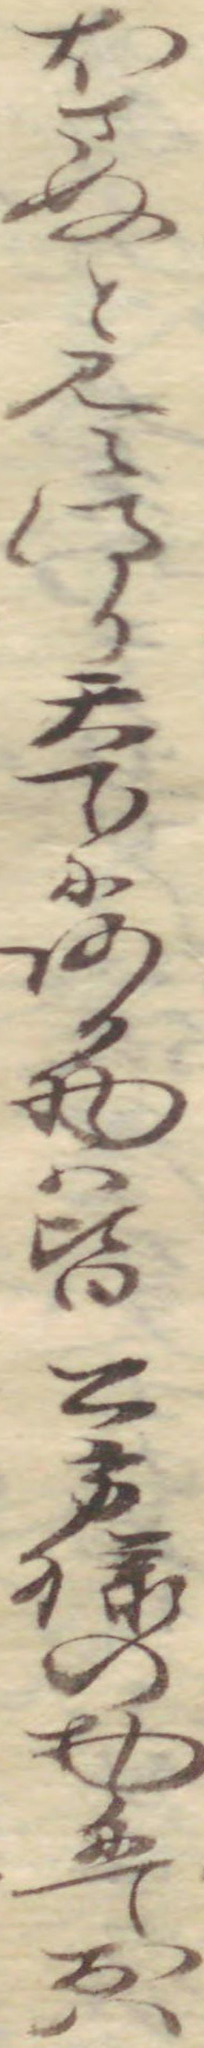ほさぬと見え侍り天下にある物は皆公方様の物にておは
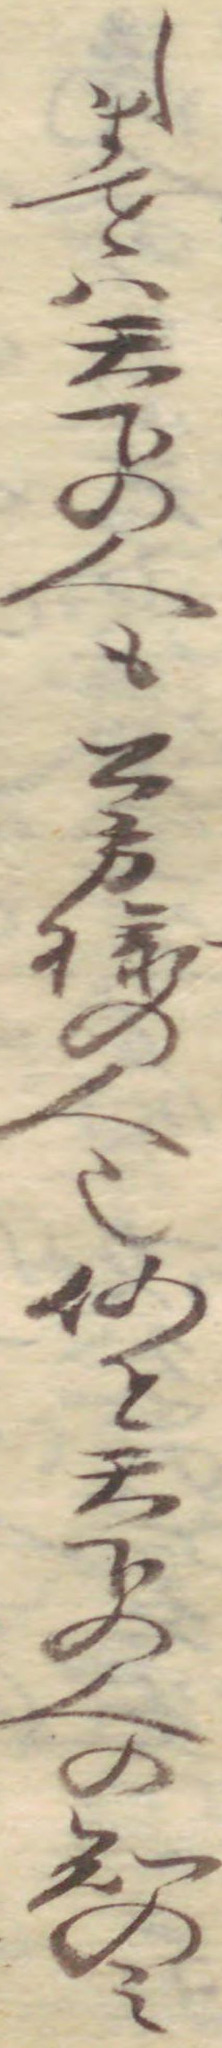しませは天下の人も公方様の人也何そ天下の人の知のみ
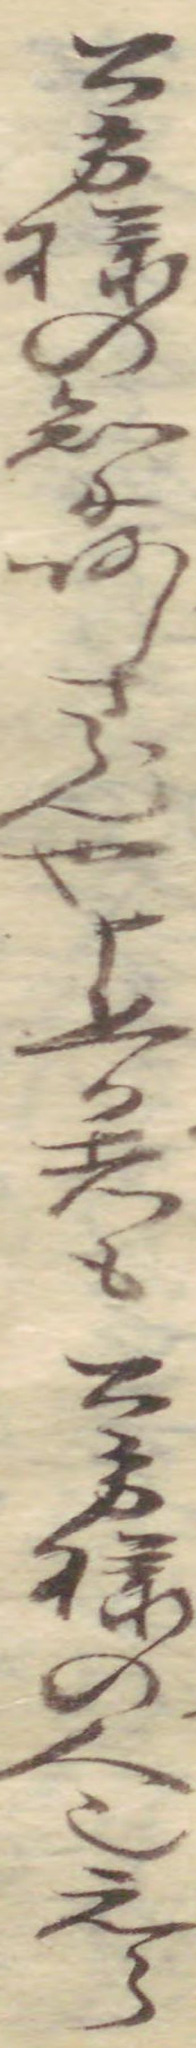公方様の知にあらさらんや申上る者も公方様の人也えら
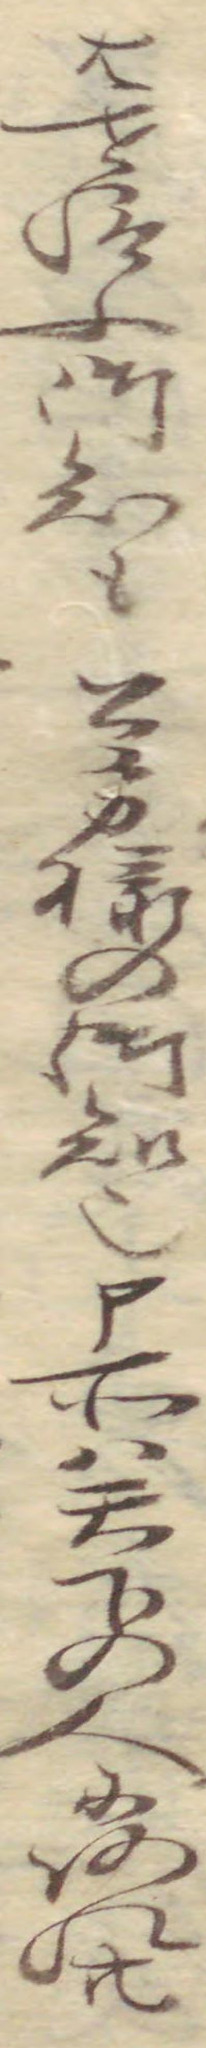はせ給ふ御知も公方様の御知也申所は天下の人にあれ共
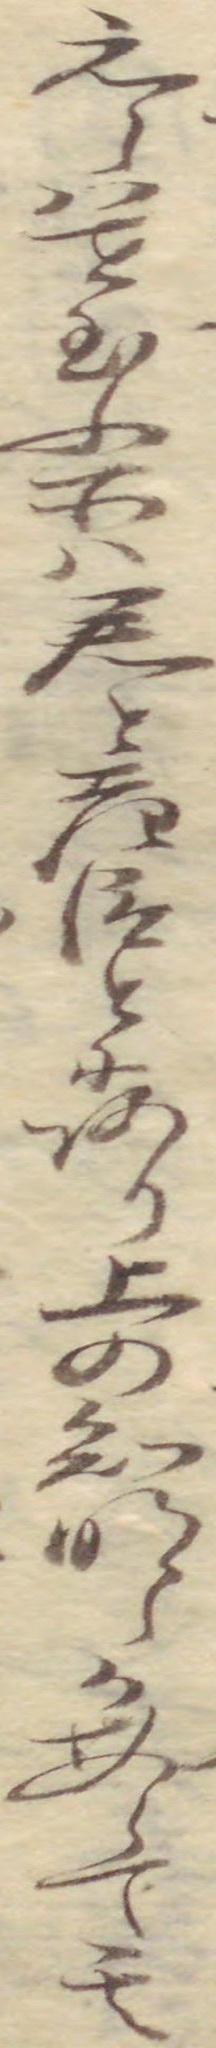えらはせ玉ふ所は君と老臣とにあり上の知明らかならて其
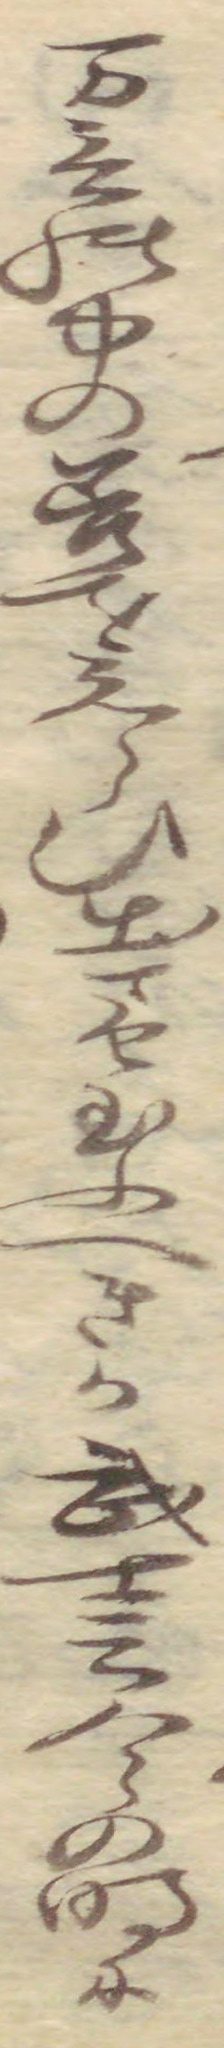万言の中の善をえらひ出させ玉ふへきか武士云今の時に
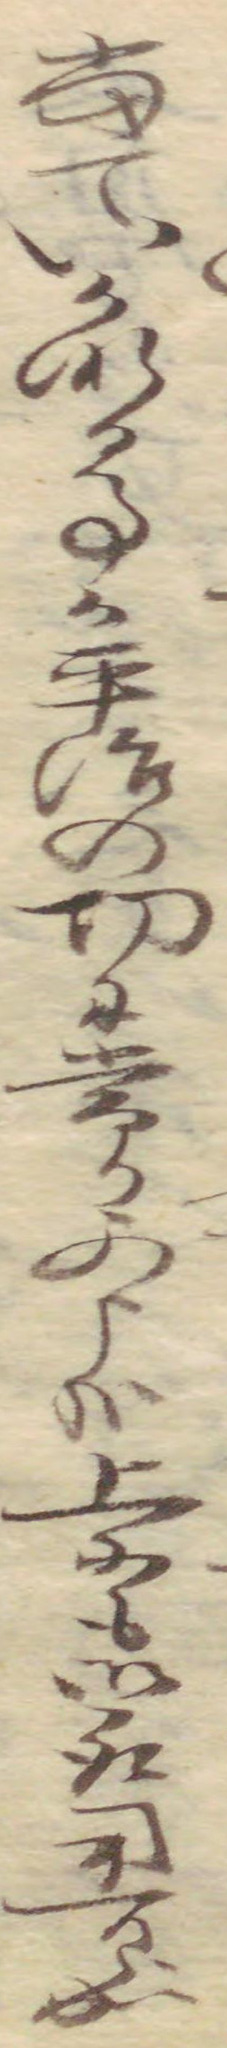当ていかなる事か平治の功に当り可申哉上にも御取用可被成
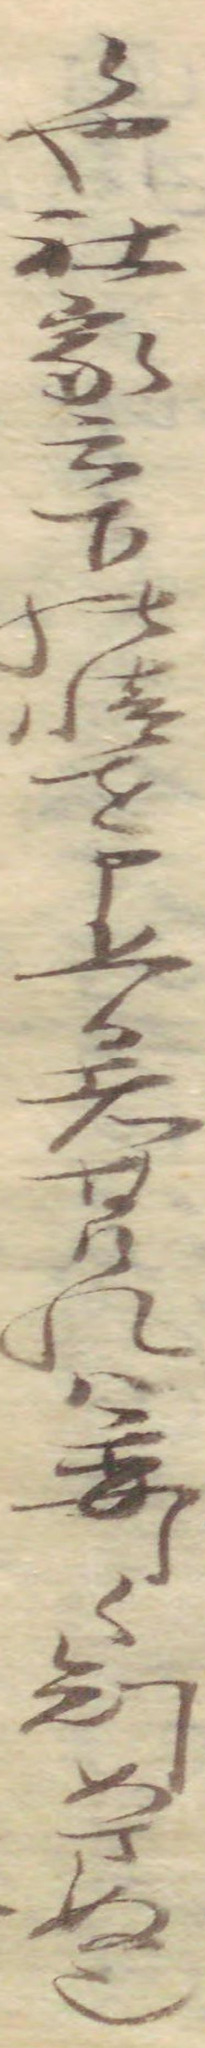候や社家云下の情を申上る者なけれは委しく知しめさぬ也
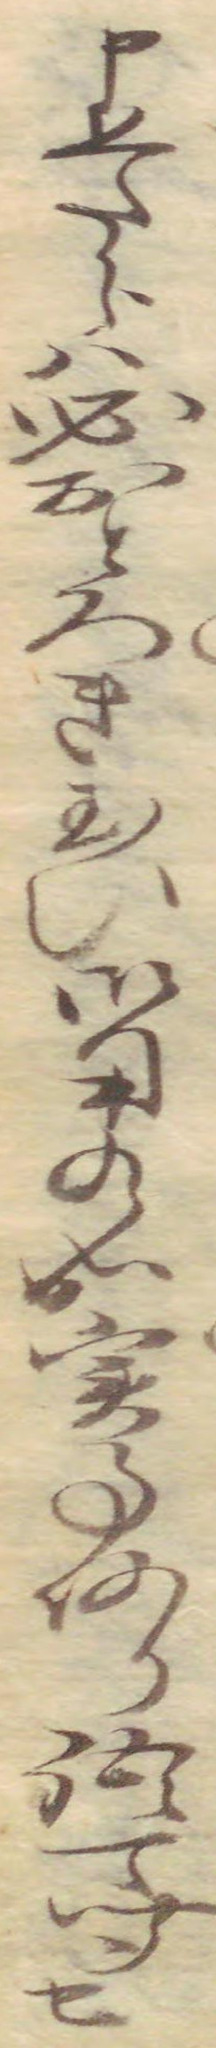申上たらは必おとろき玉ひ御用可被成実事あり語て聞せ

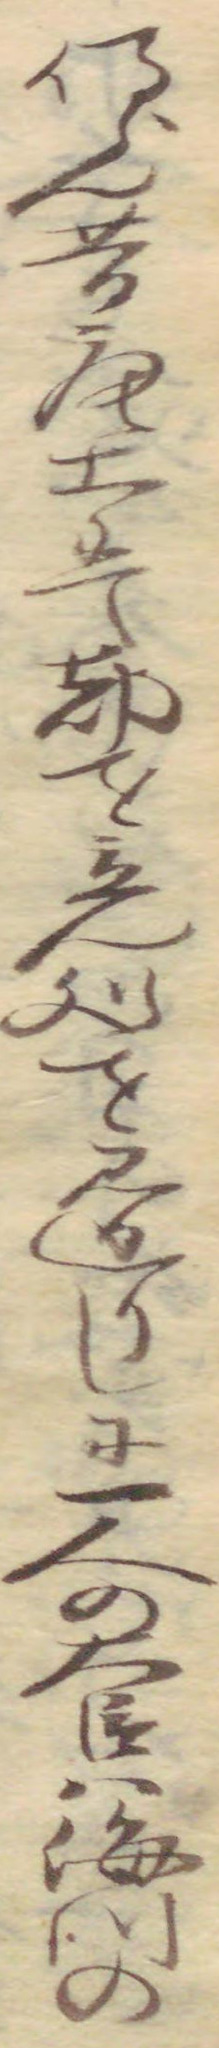侍らん昔唐土にて都を立ん処を見廻りしに一人の大臣は海川の
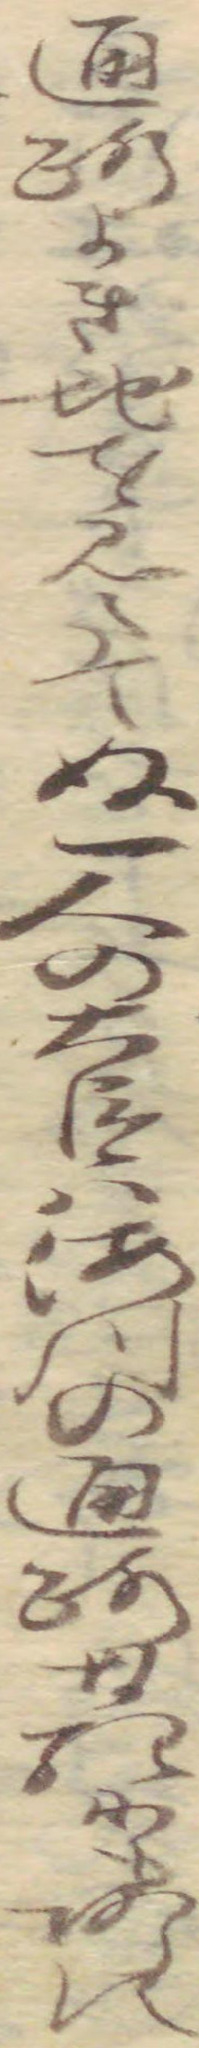通路よき地を見たてぬ一人の大臣は海川の通路なきにもあらす
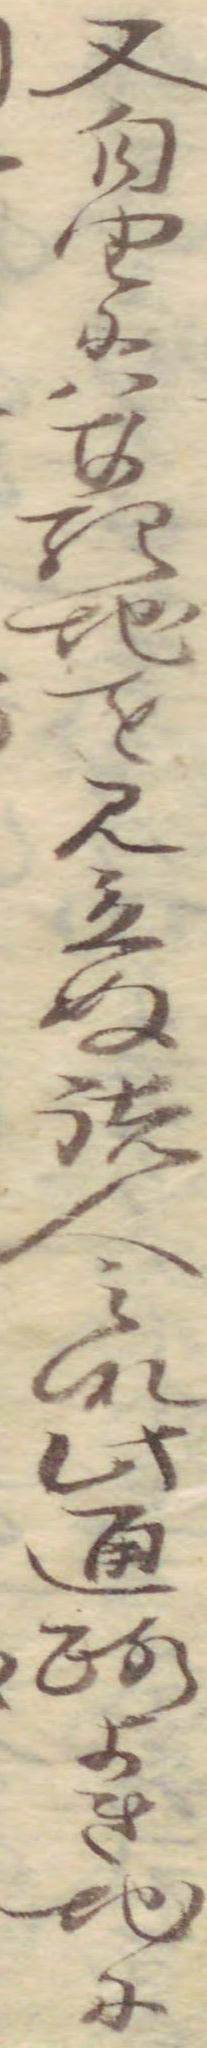又自由にはなき地を見立ぬ諸人みな此通路よき地に
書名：鶯宿雑記. 巻263-264
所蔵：国立国会図書館 National Diet Library, JAPAN
